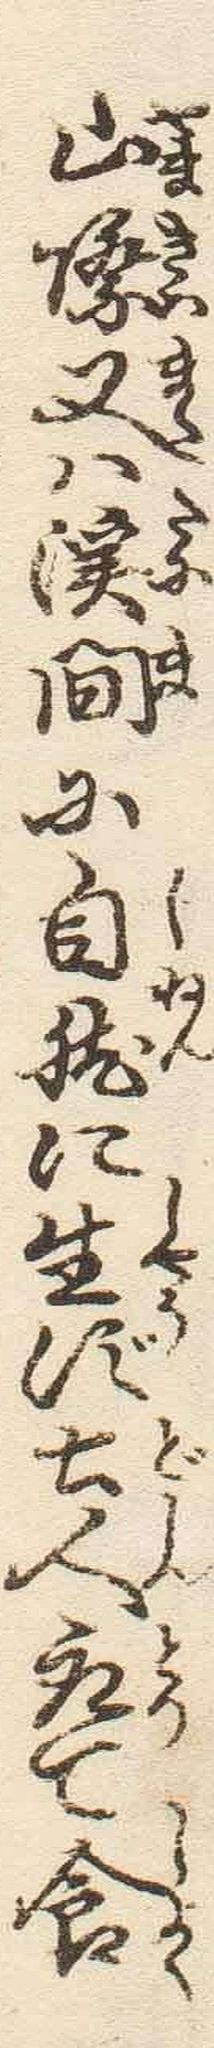山際又は溪間に自然に生ず土人取て食
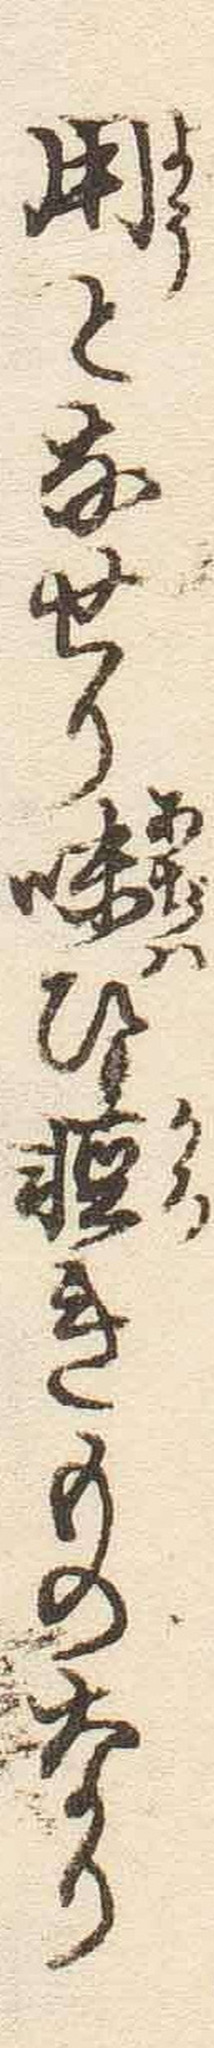用となせり味ひ輕きものなり

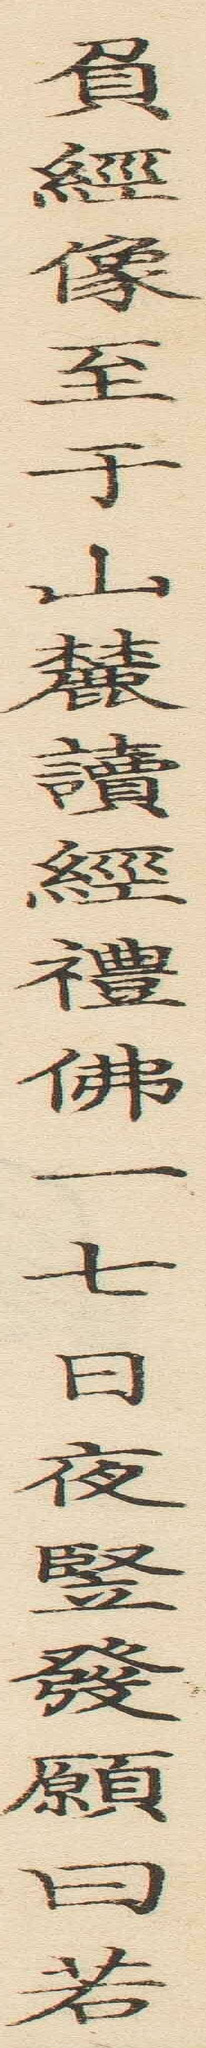負經像至于山麓讀經禮佛一七日夜竪發願曰若
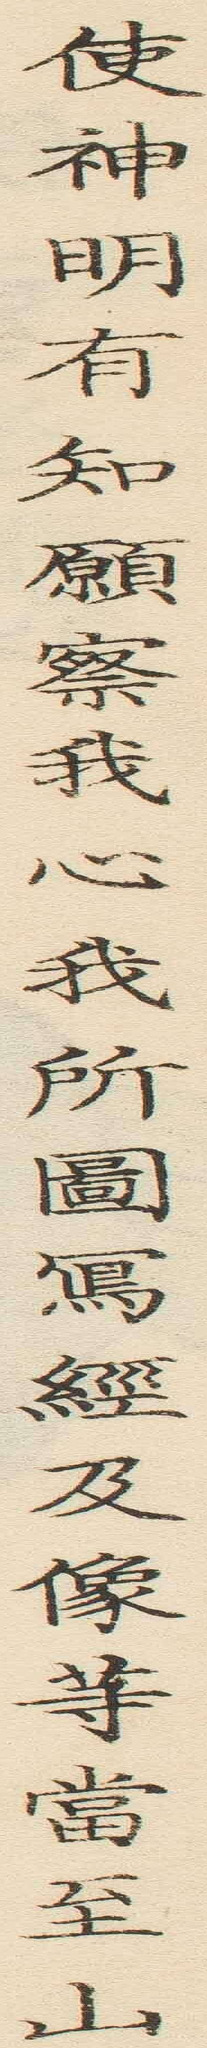使神明有知願察我心我所圖冩經及像等當至山
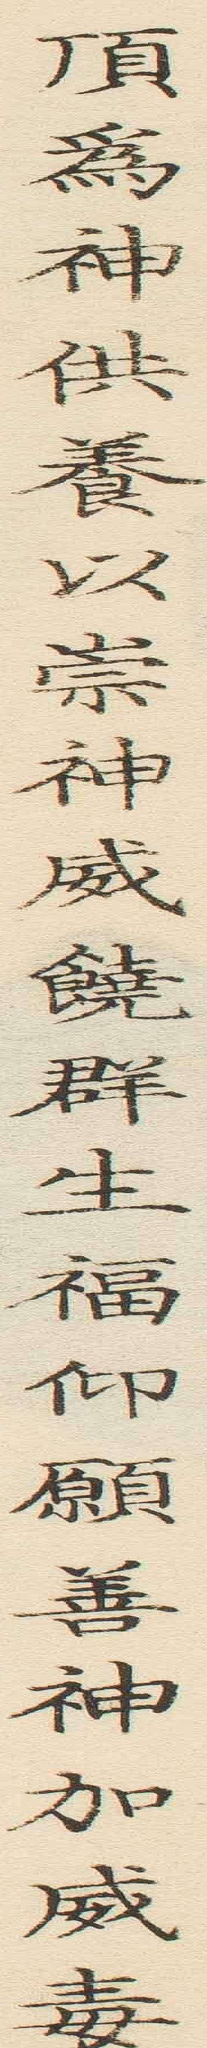頂爲神供養以崇神威饒群生福仰願善神加威毒
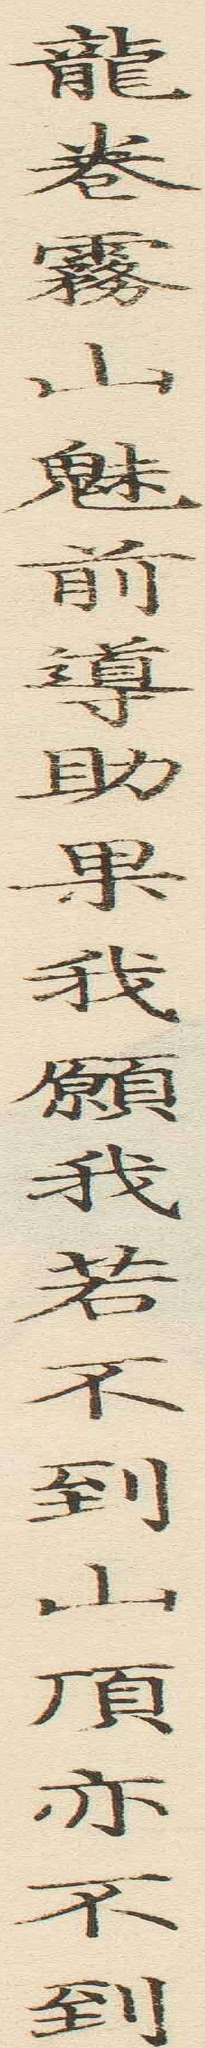龍巻霧山魅前導助果我願我若不到山頂亦不到
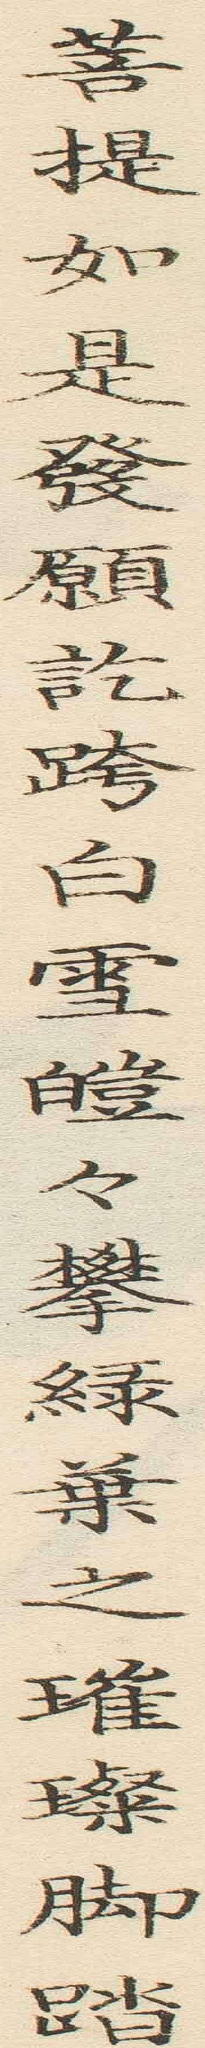菩提如是發願訖跨白雪皚々攀緑葉之璀璨脚踏
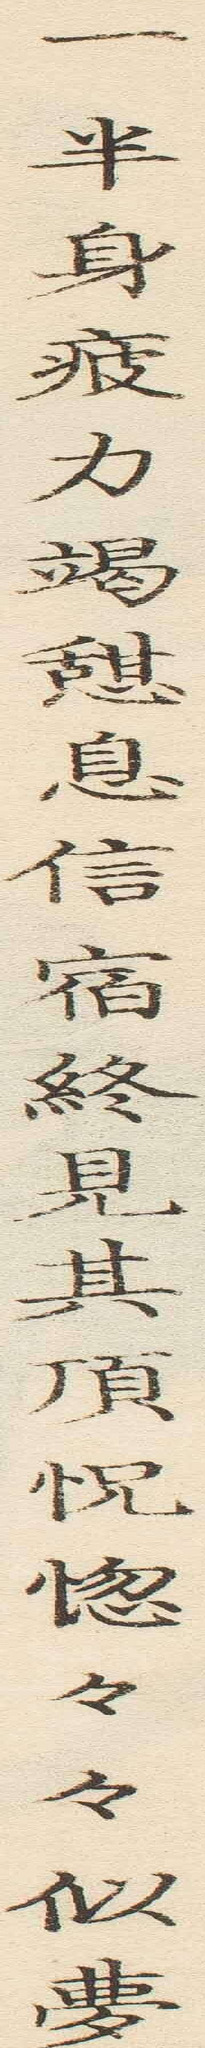一半身疲力竭憇息信宿終見其頂怳惚々々似夢
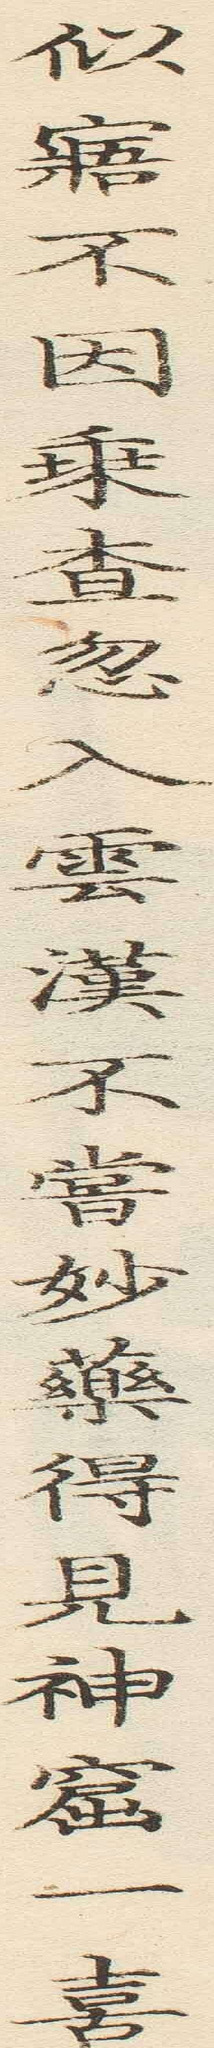似窹不因乘査忽入雲漢不嘗妙藥得見神窟一喜
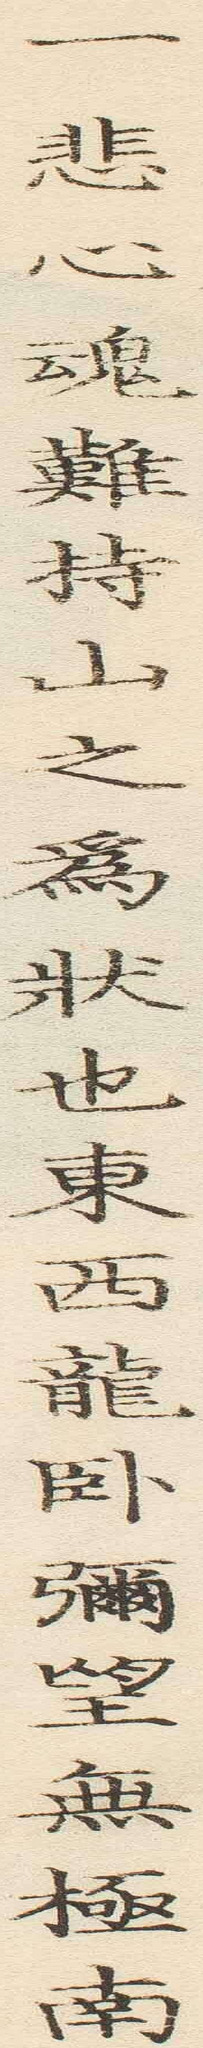一悲心魂難持山之爲狀也東西龍臥彌望無極南
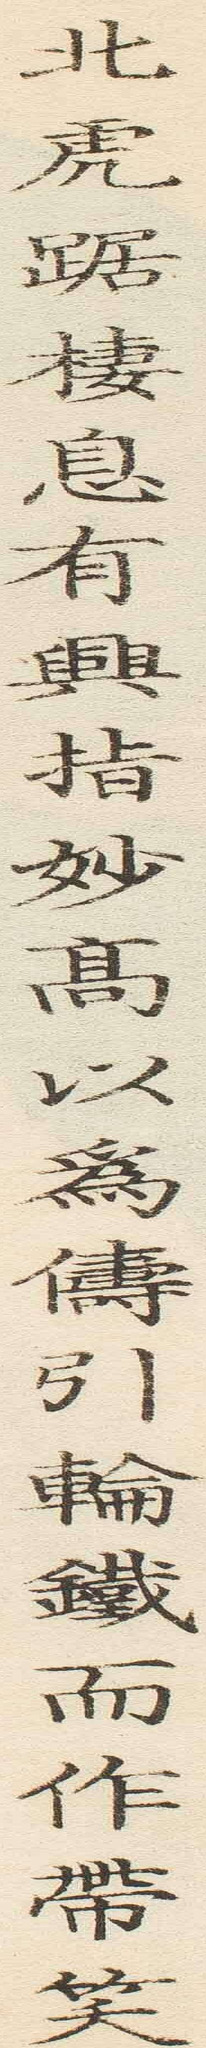北虎踞棲息有興指妙髙以爲儔引輪鐵而作帶笑
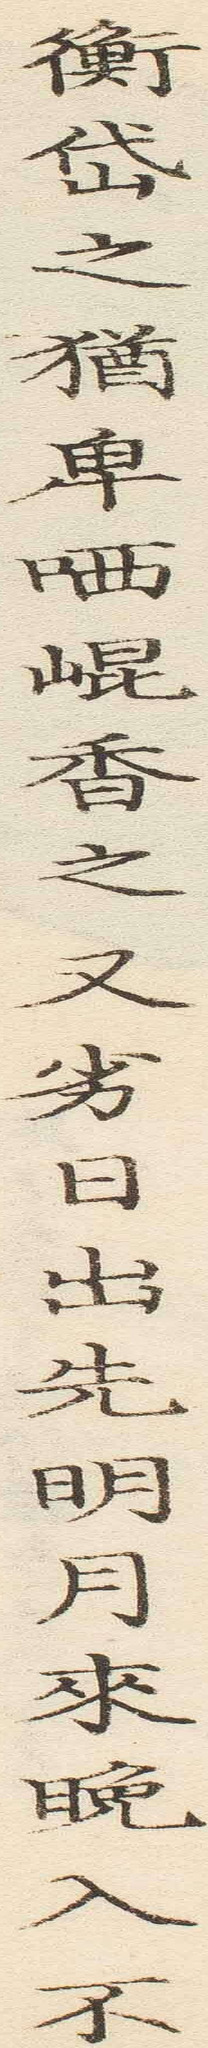衡岱之猶卑哂崐香之又劣日出先明月來晩入不
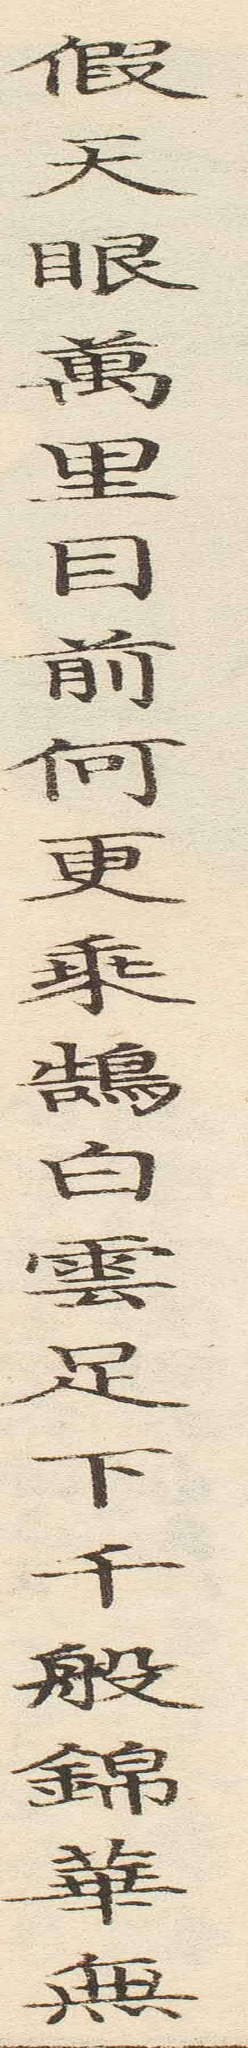假天眼萬里目前何更乘鵠白雲足下千般錦華無
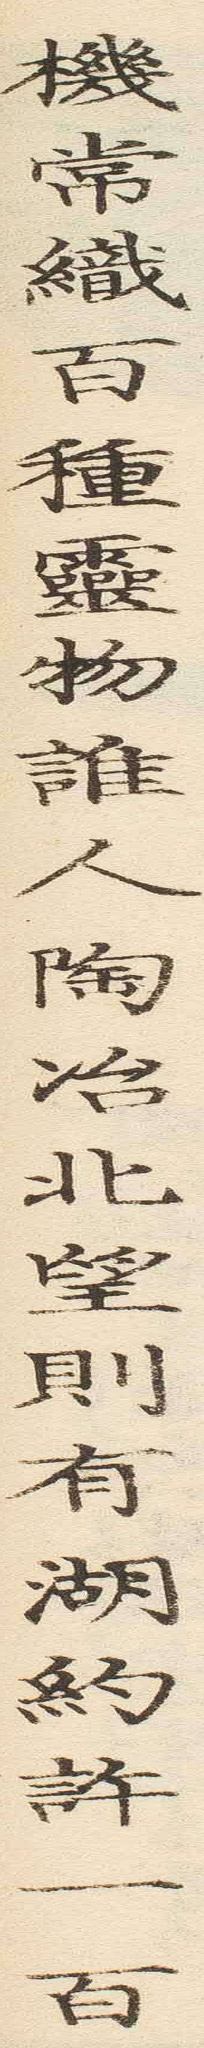機常織百種靈物誰人陶冶北望則有湖約許一百
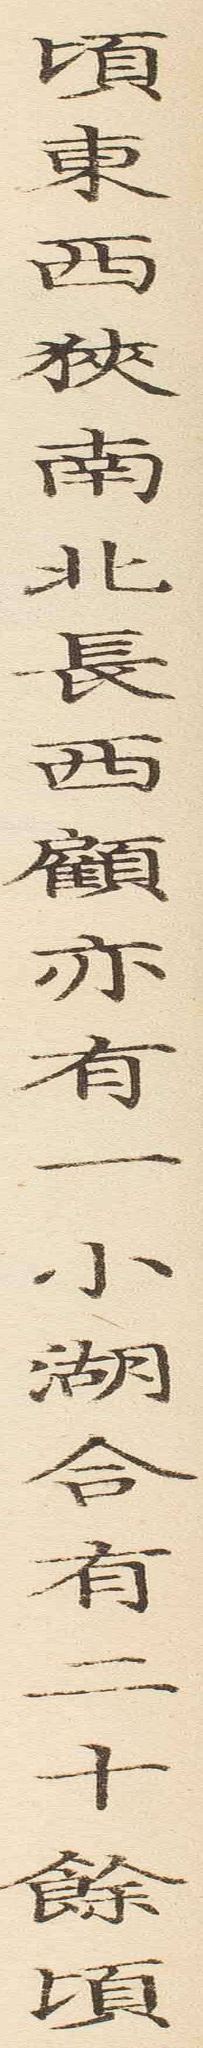頃東西狹南北長西顧亦有一小湖合有二十餘頃
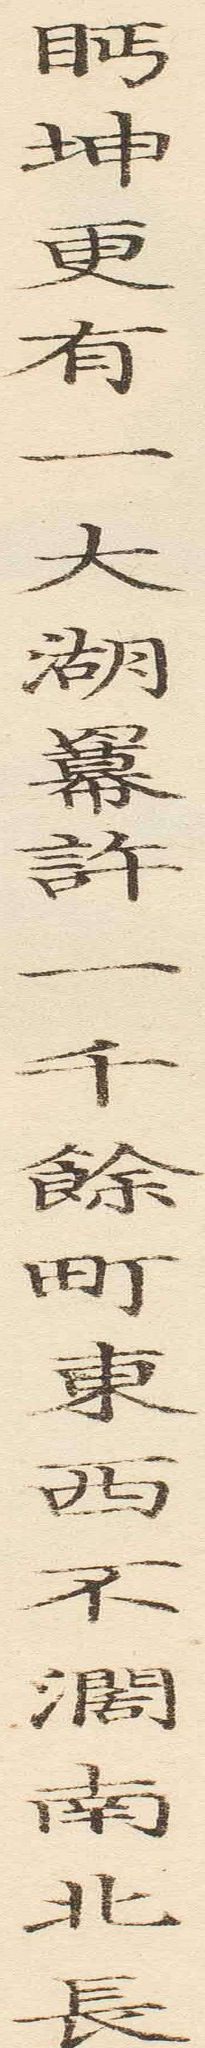眄坤更有一大湖羃許一千餘町東西不濶南北長
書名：日光山志
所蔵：東京学芸大学附属図書館 国文学研究資料館
